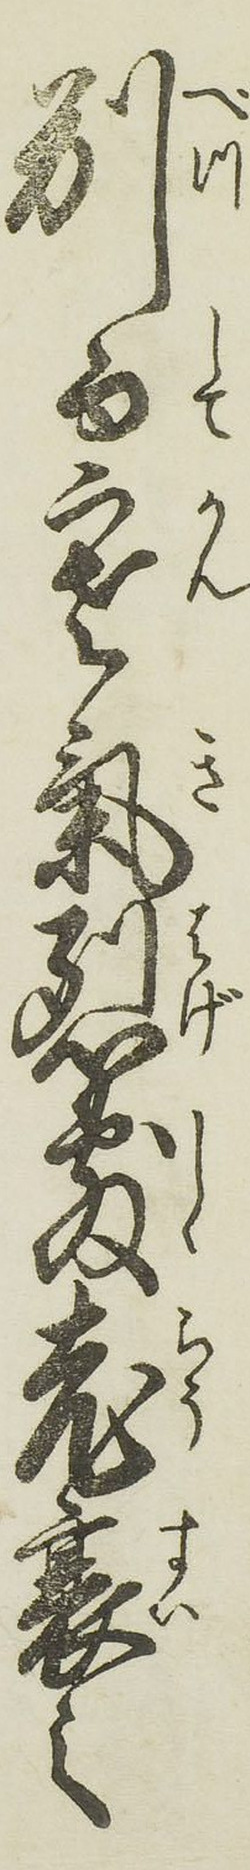別而寒気烈敷老衰之
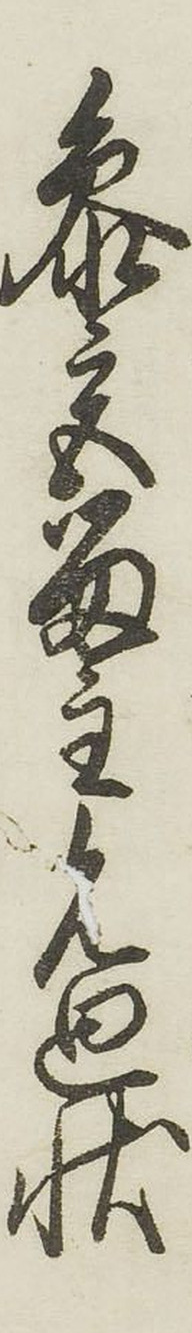参宮留主見廻状

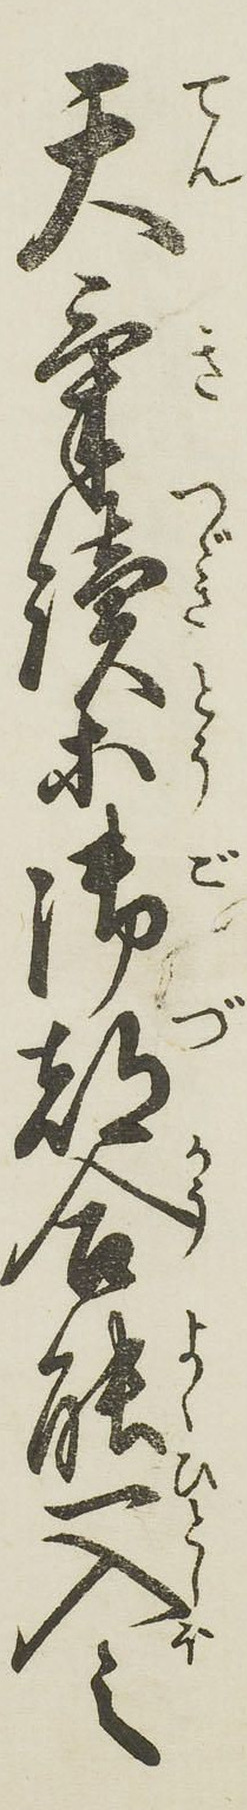天気続等御都合能一入之
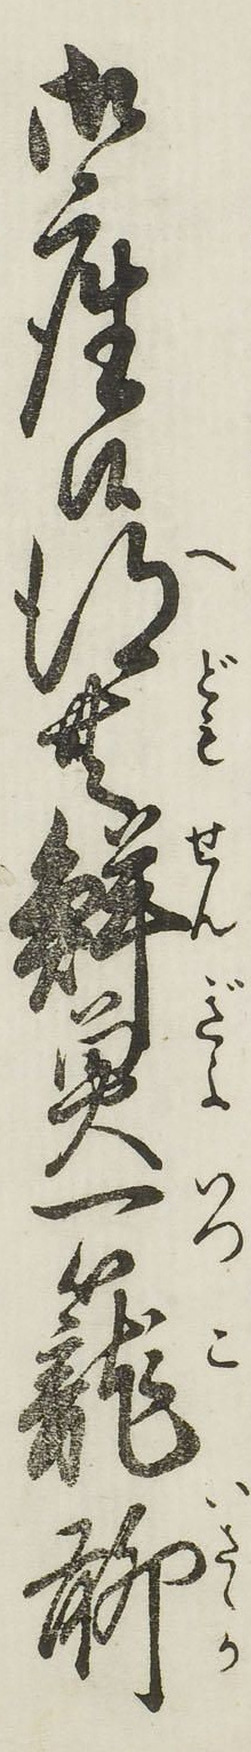御座候得共鮮魚一籠聊
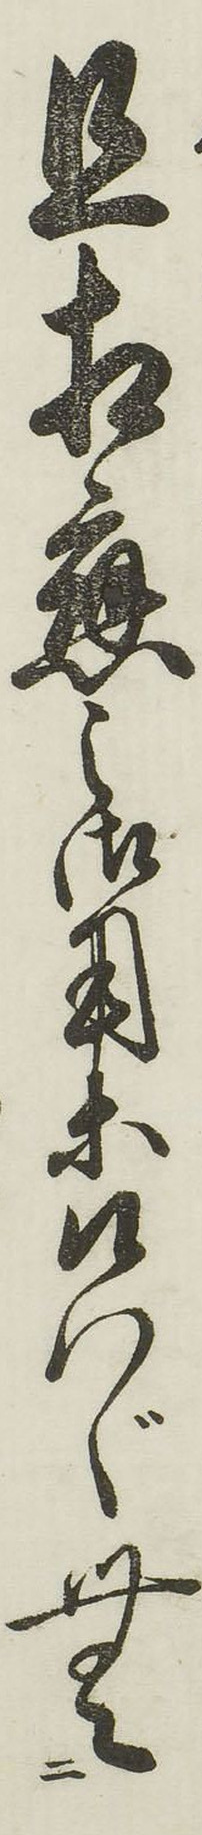且相応之御用等候はゞ無

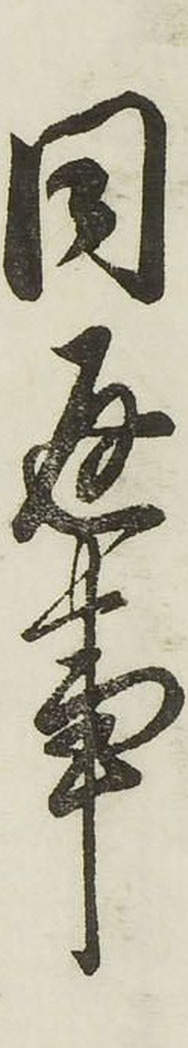同返事
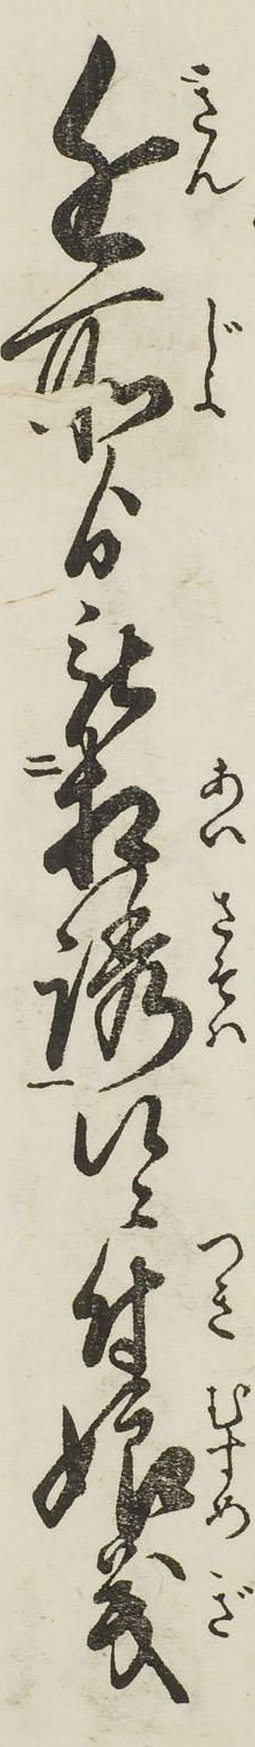近所ゟ被相誘候ニ付娘義
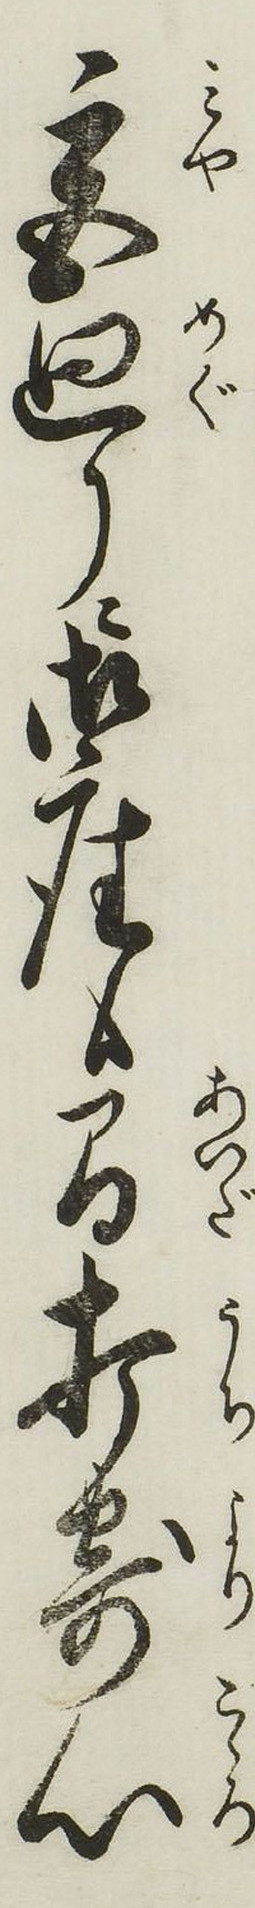宮廻りに御座候間打寄心

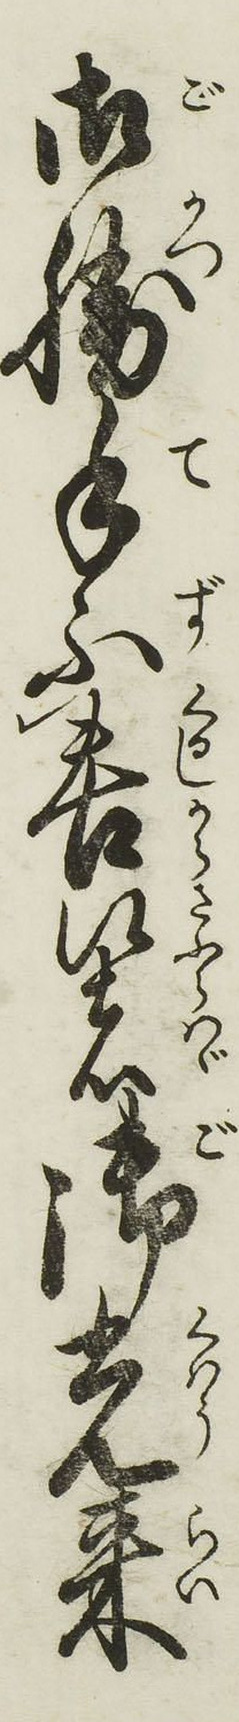御勝手不苦候者御光来
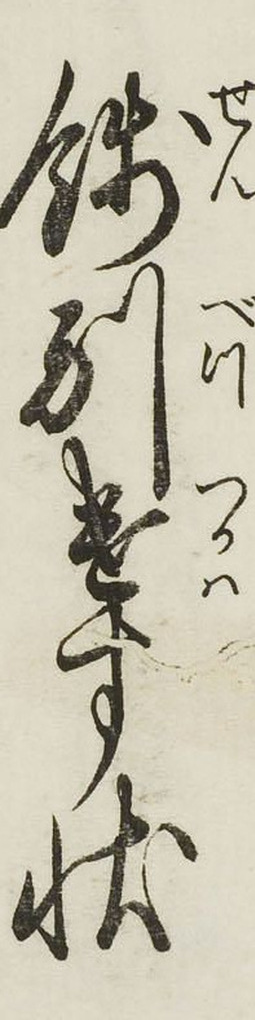餞別遣す状
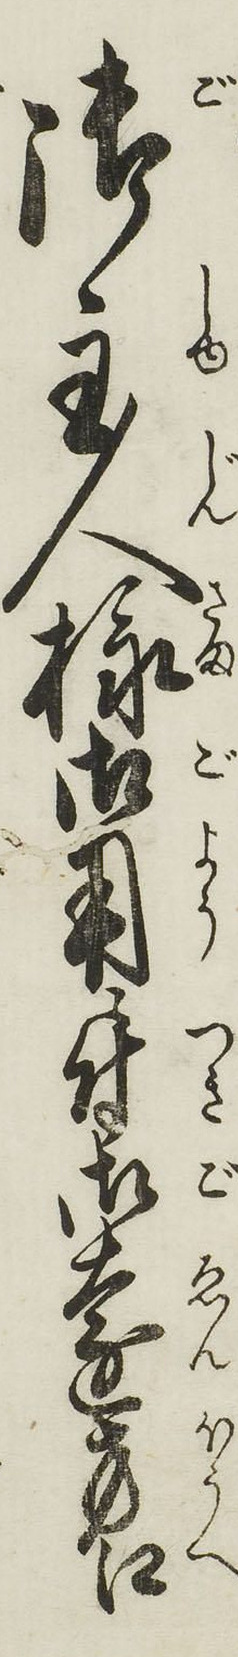御主人様御用付御遠方江

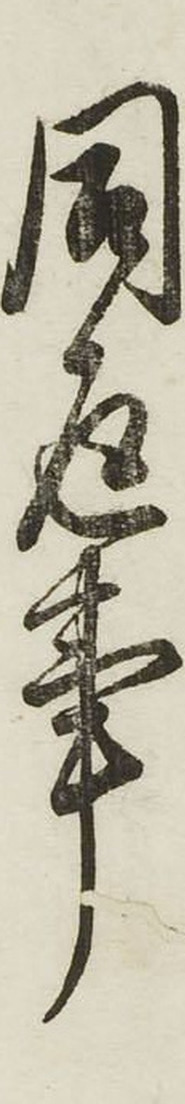同返事
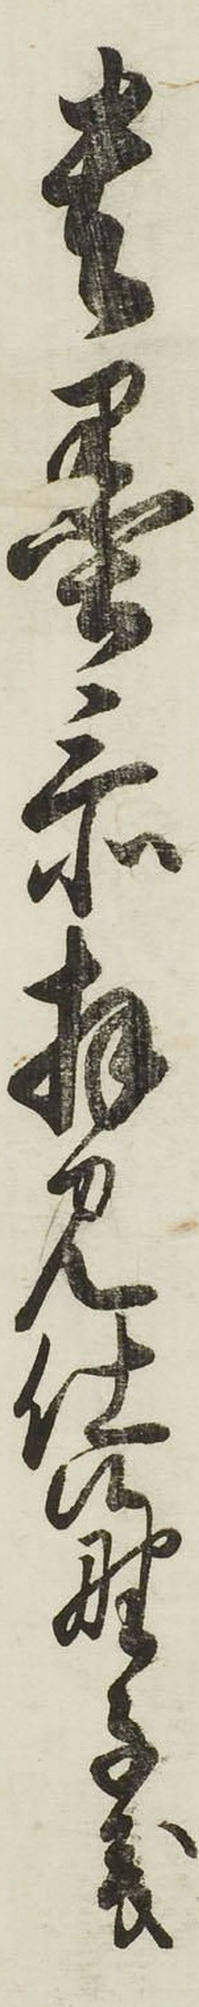貴墨忝拝見仕候野子義

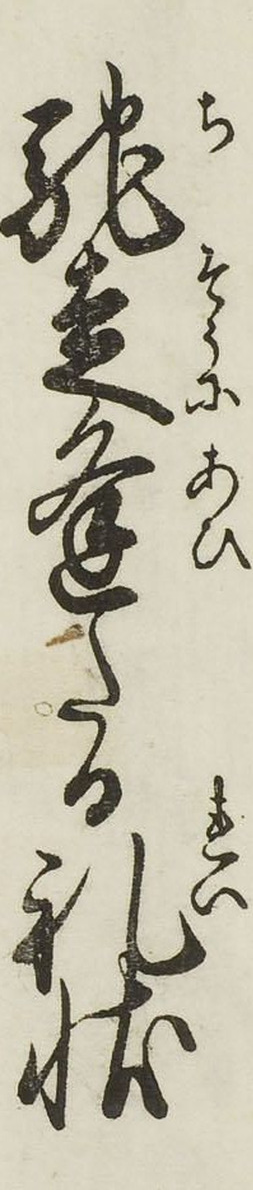馳走逢たる礼状

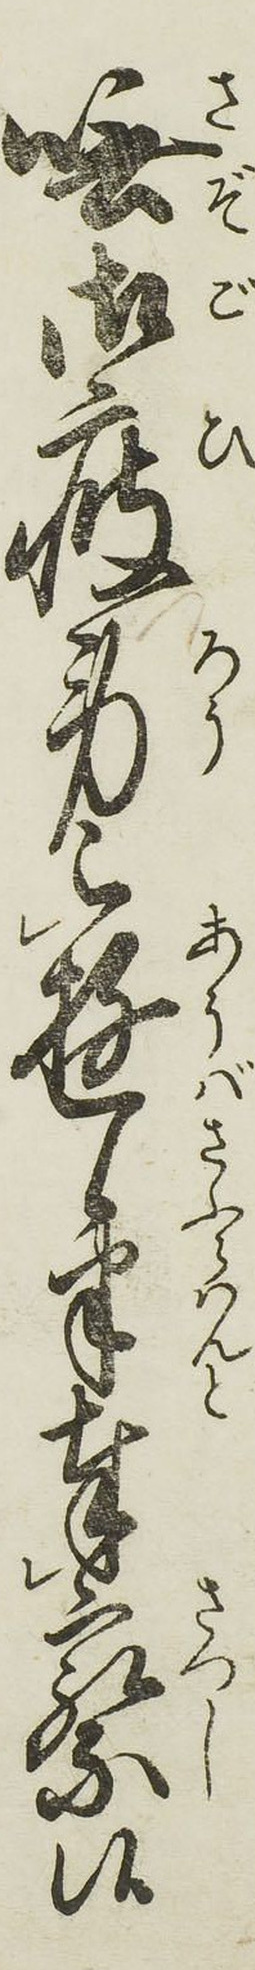嘸御疲労被遊候半奉察候

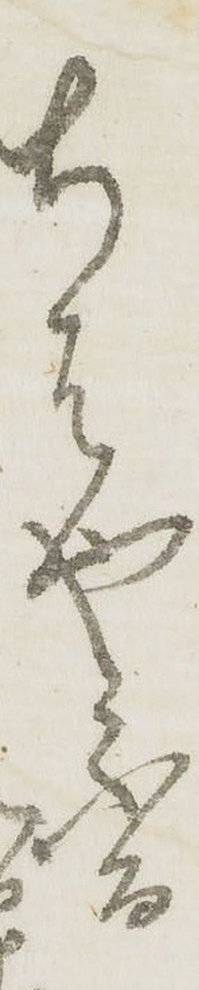ちはやふる
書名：商人書翰便覧
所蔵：東京学芸大学教育コンテンツアーカイブ
